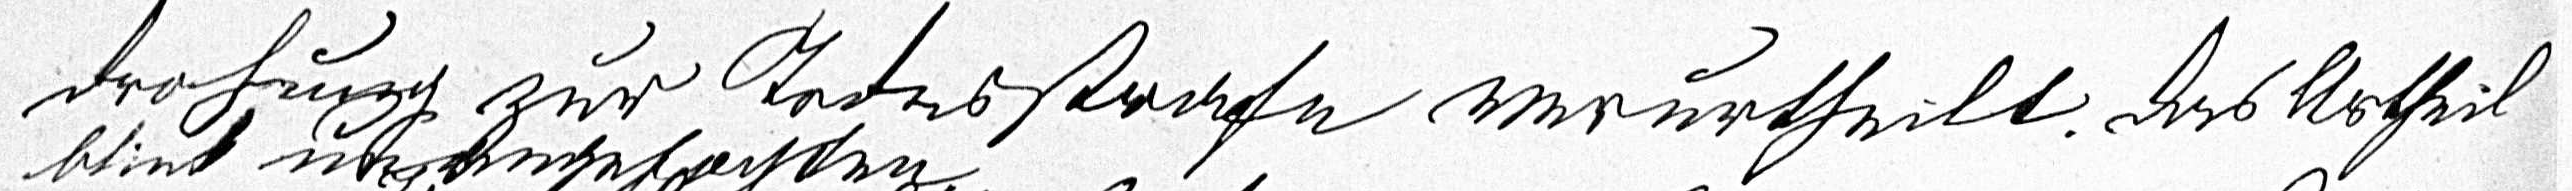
Drohung zur Todesstrafe verurtheilt. Das Urtheil
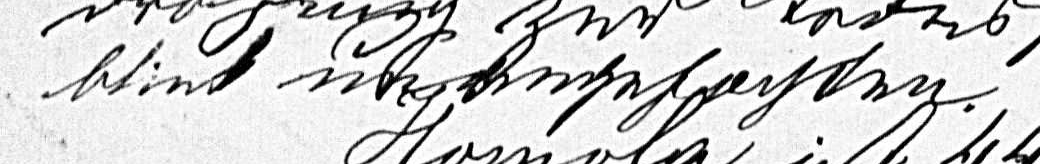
blieb unangefochten.
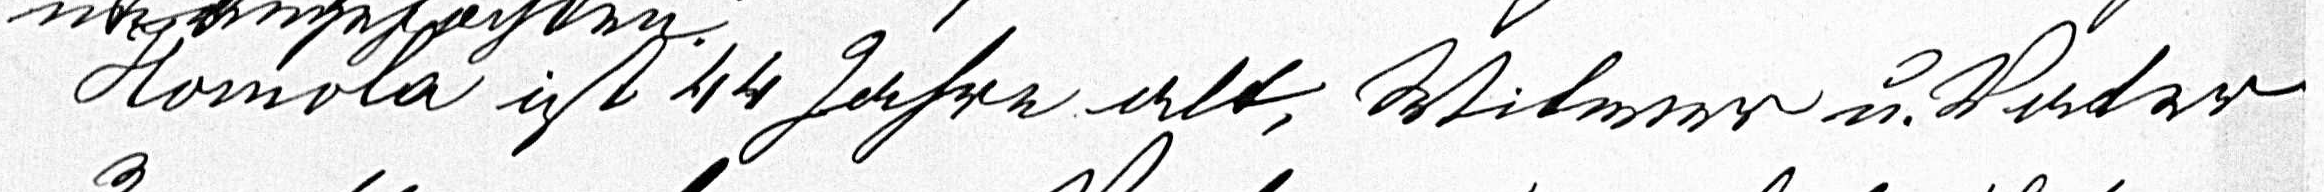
Homola ist 44 Jahre alt, Witwer u. Vater
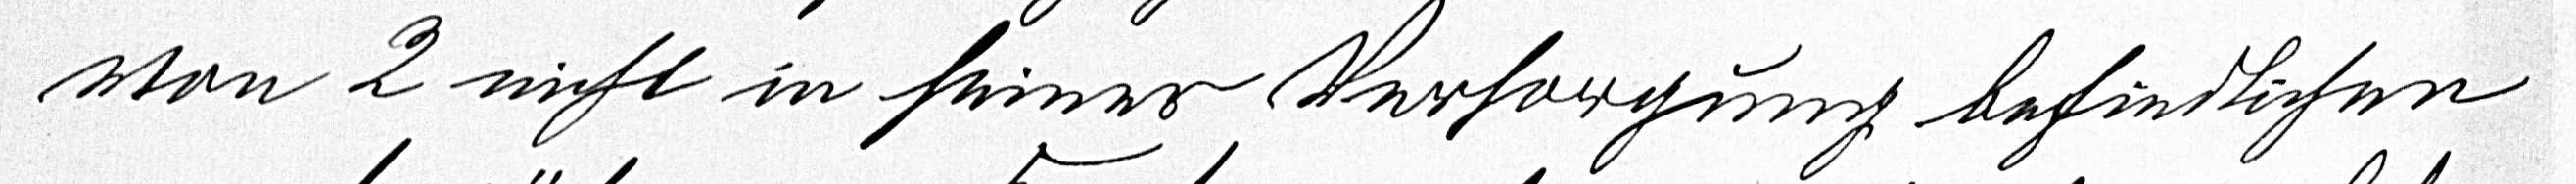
von 2 nicht in seiner Versorgung befindlichen
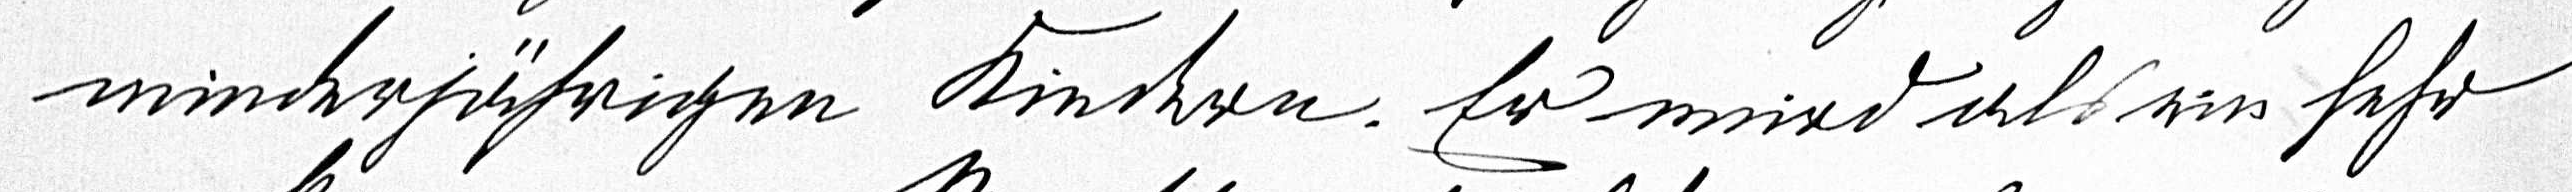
minderjährigen Kindern. Er wird als ein sehr
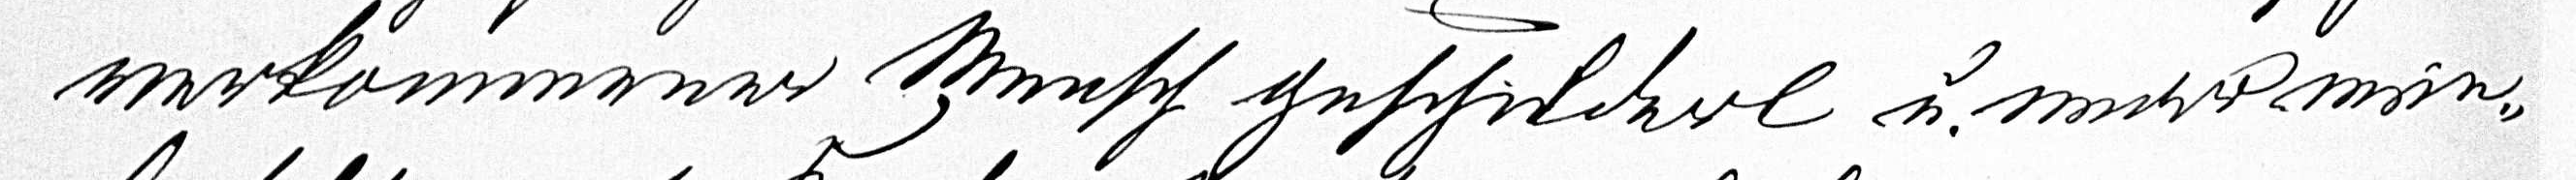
verkommener Mensch geschildert u. war wie¬
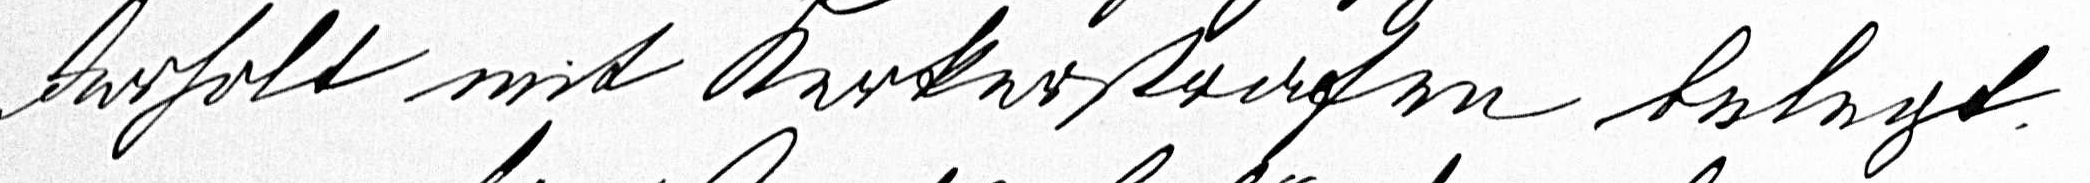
derholt mit Kerkerstrafen belegt.
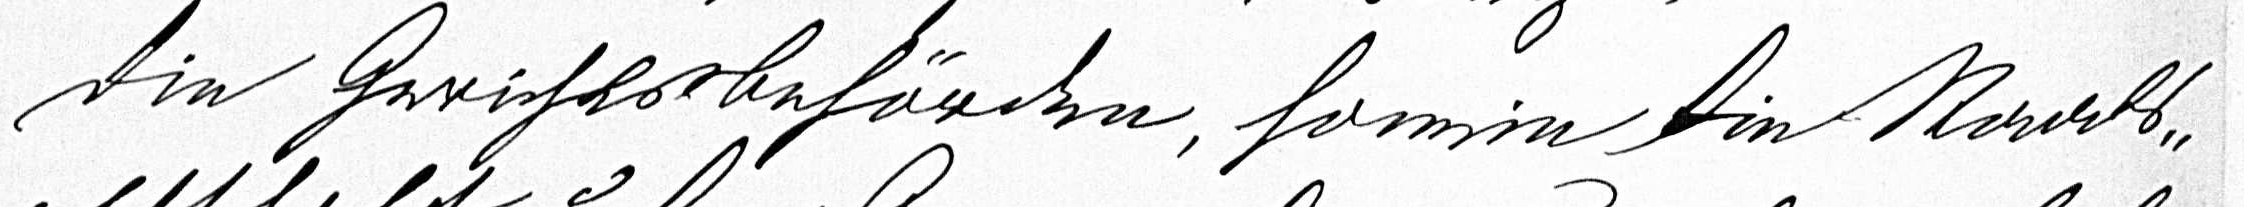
Die Gerichtsbehörden, sowie die Staats¬
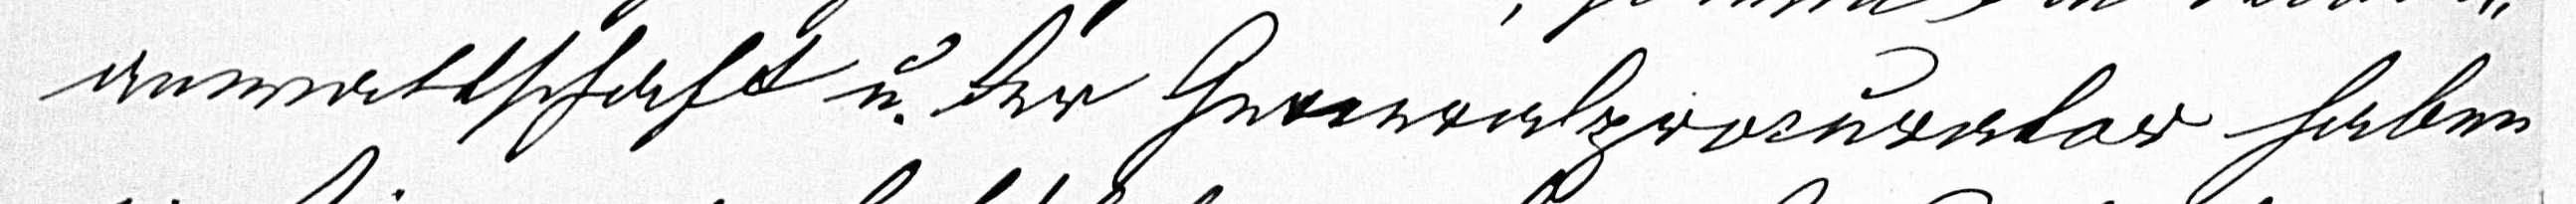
anwaltschaft u. der Generalprocurator haben
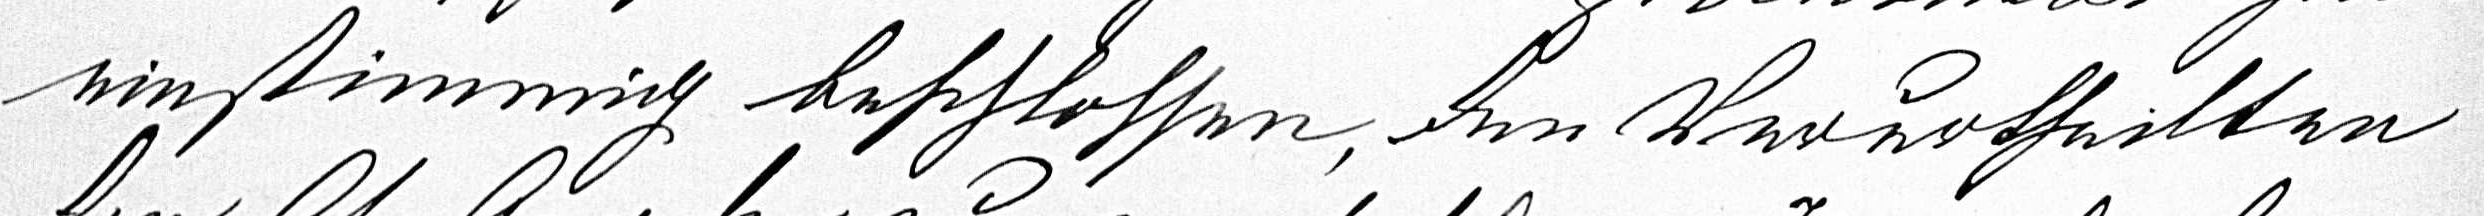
einstimmig beschlossen, den Verurtheilten
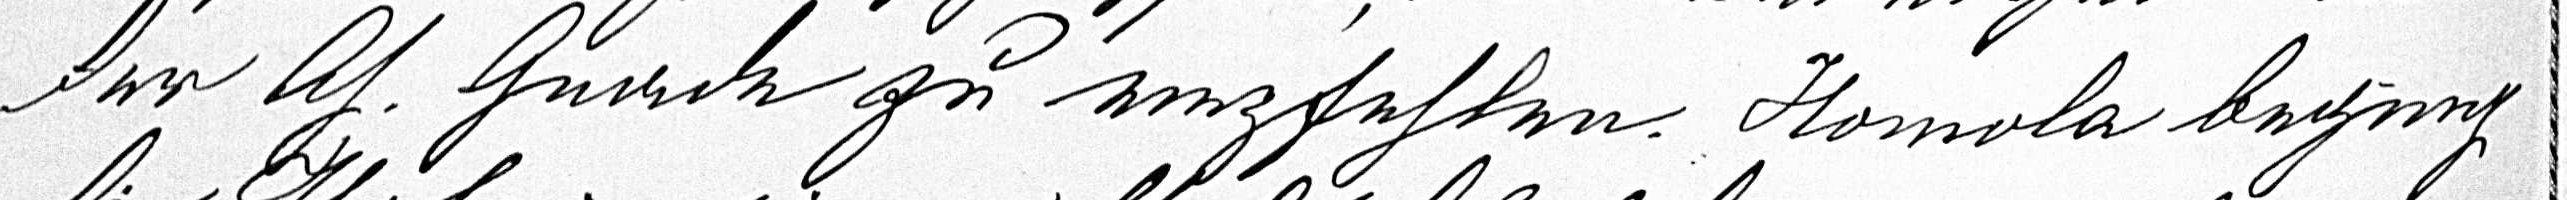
der Ah. Gnade zu empfehlen. Homola beging
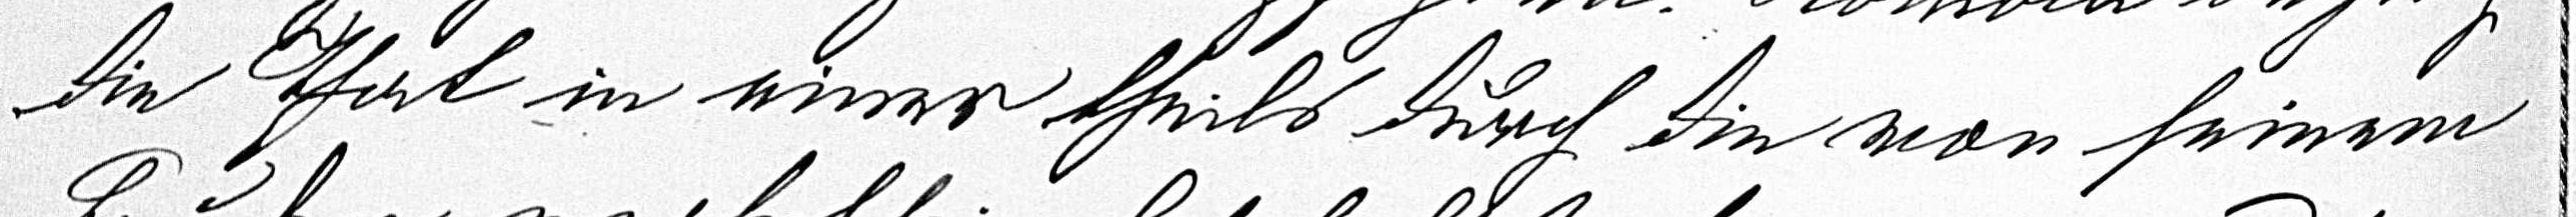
die That in einer theils durch die von seinem
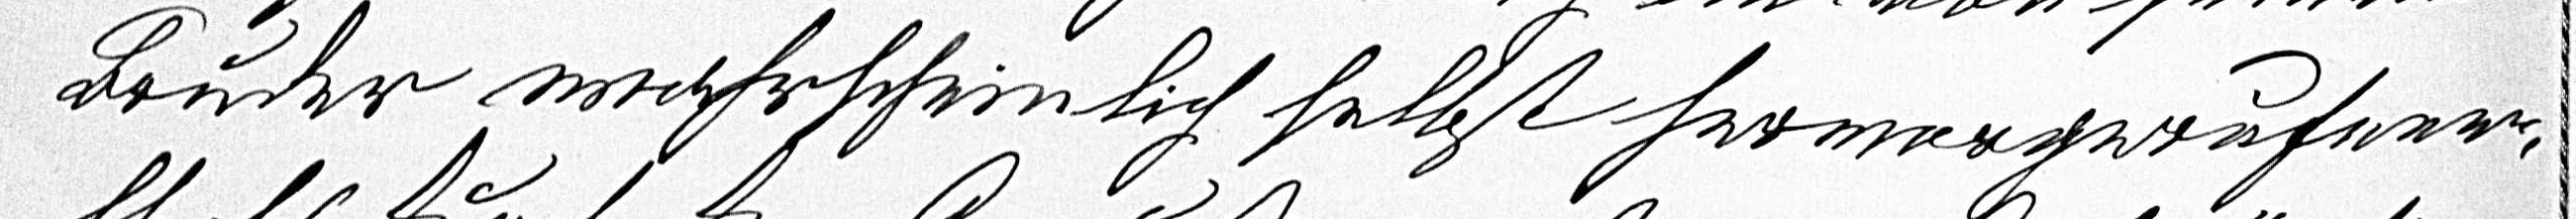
Bruder wahrscheinlich selbst hervorgerufener,
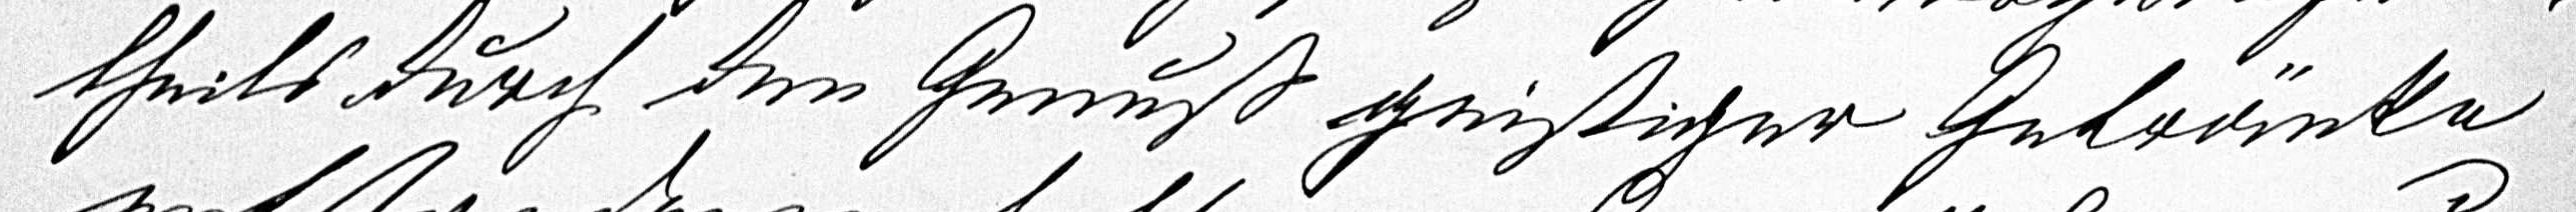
theils durch den Genuß geistiger Getränke
